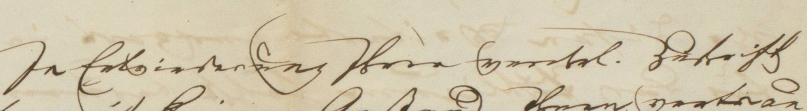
In Erwiederung Ihrer verehrl. Zuschrift
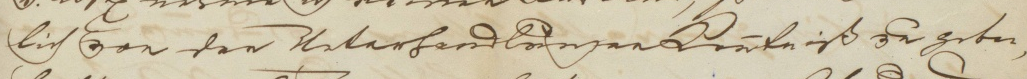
lich von den Unterhandlungen Kenntniß zu geben,
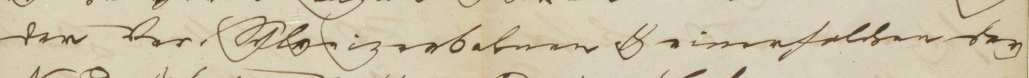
der Ver. Schweizerbahnen & einer solchen der
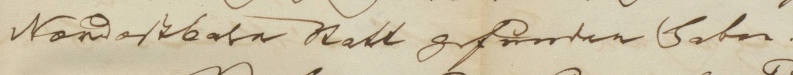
Nordostbahn Statt gefunden haben.
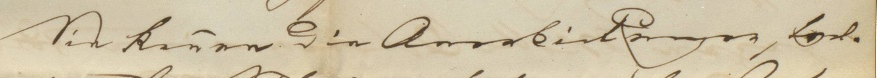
Sie kennen die Anerbietungen, wel-
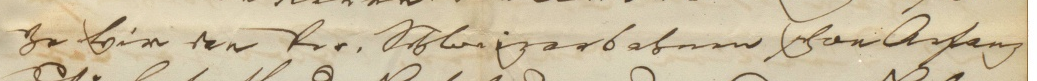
che wir den Ver. Schweizerbahnen schon Anfang
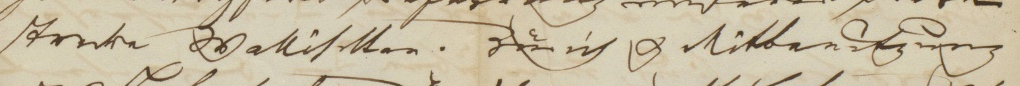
strecke Wallisellen–Zürich & Mitbenutzung
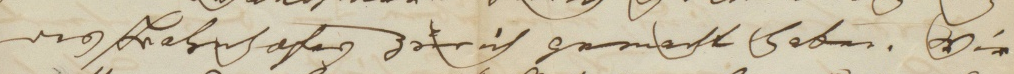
des Bahnhofes Zürich gemacht haben. Wir
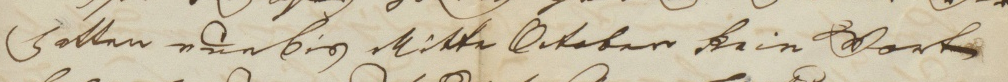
hatten nun bis Mitte October kein Wort
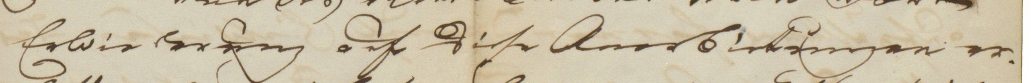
Erwiederung auf diese Anerbietungen er-
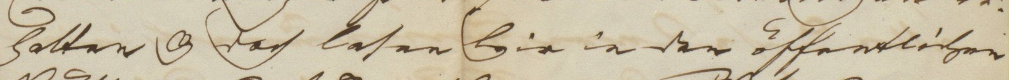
halten & doch lesen wir in den öffentlichen
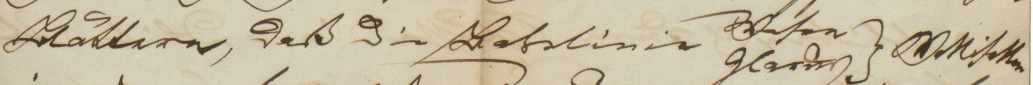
Blättern, daß die Bahnlinie WesenGlarusWallisellen
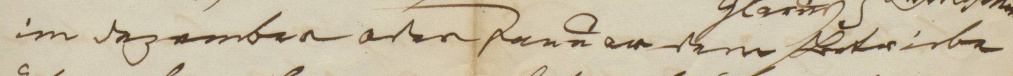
im Dezember oder Januar dem Betriebe
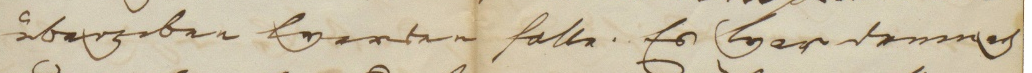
übergeben werden solle. Es war demnach
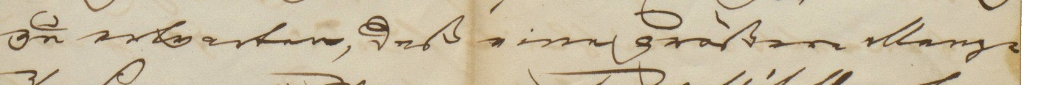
zu erwarten, daß eine größere Menge
